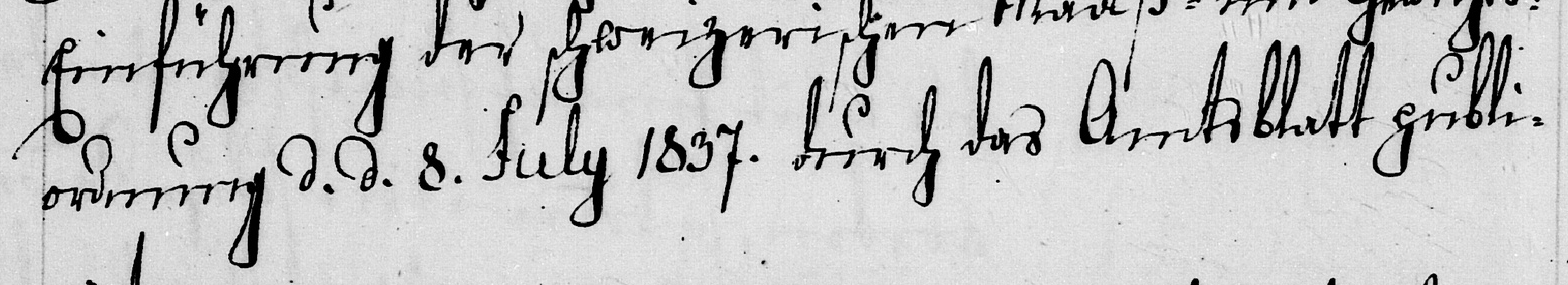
ordnung d. d. 8. July 1837. durch das Amtsblatt publi¬
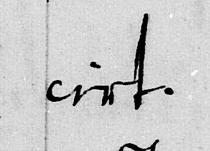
cirt.
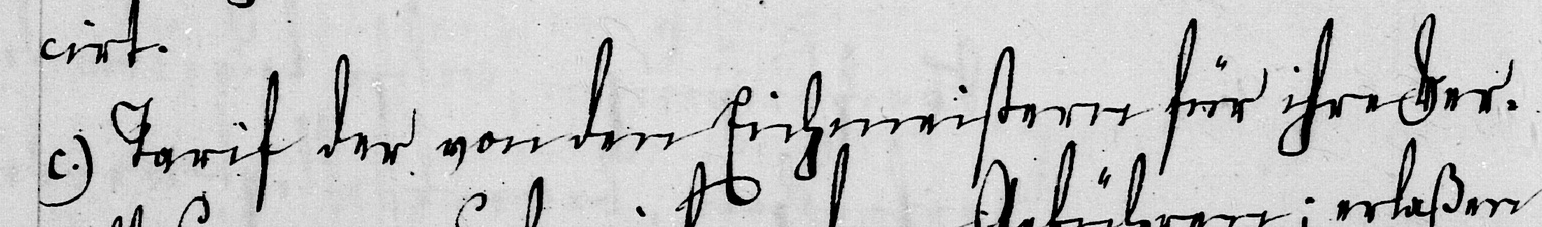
c.) Tarif der von den Eichmeistern für ihre Ver¬
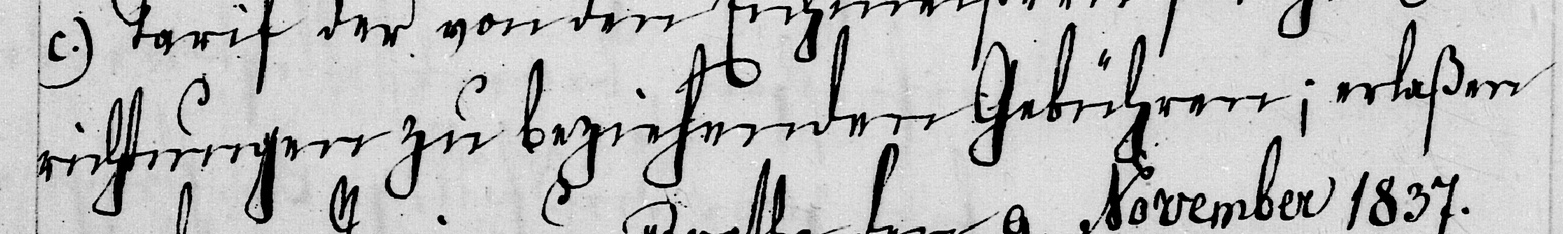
richtungen zu beziehenden Gebühren; erlaßen
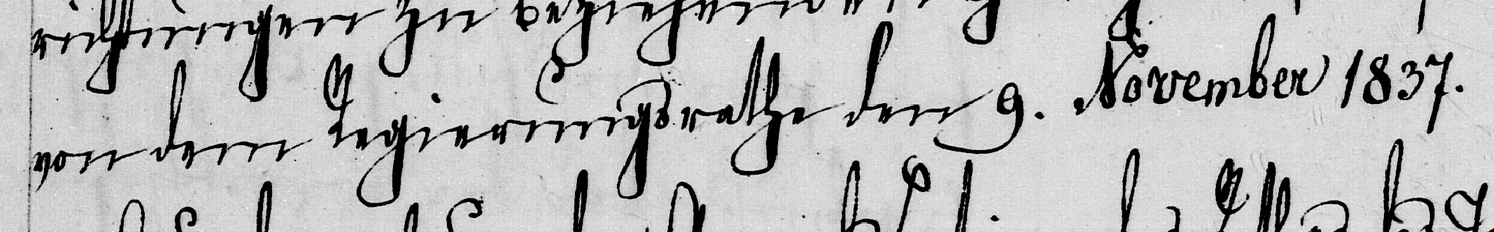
von dem Regierungsrathe den 9. November 1837.
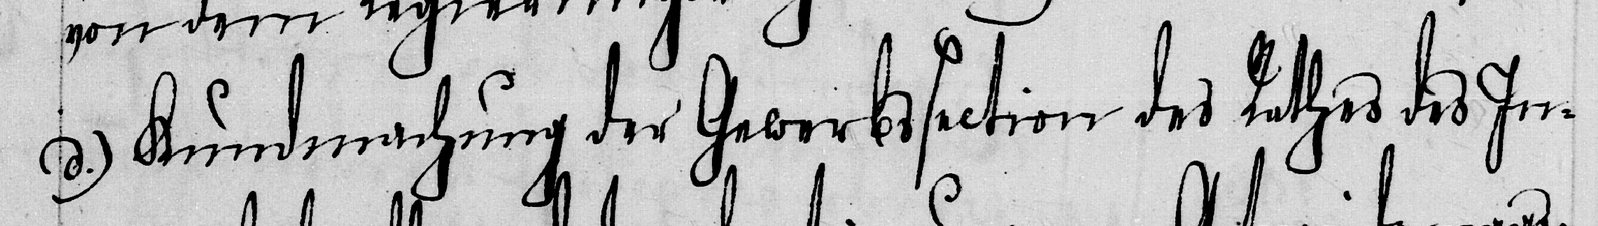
d.) Kundmachung der Gewerbssection des Rathes des In¬
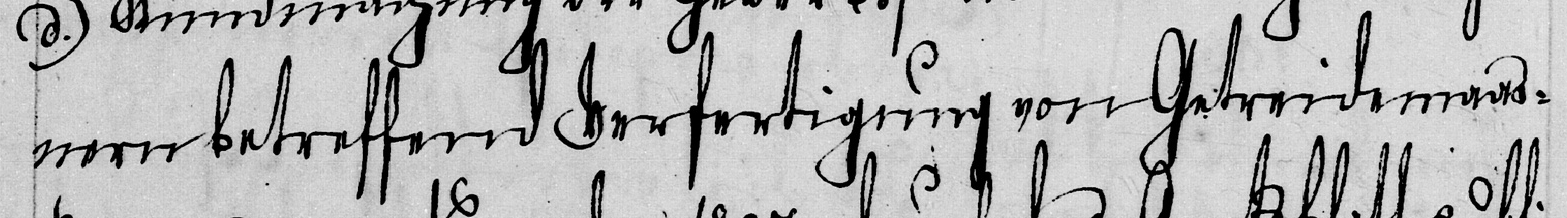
nern betreffend Verfertigung von Getreidemaaß¬
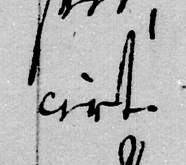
cirt.
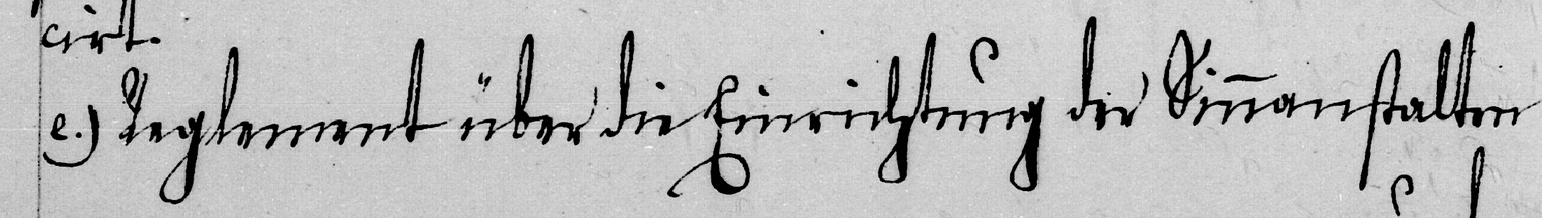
e.) Reglement über die Einrichtung der Sinnanstalten
